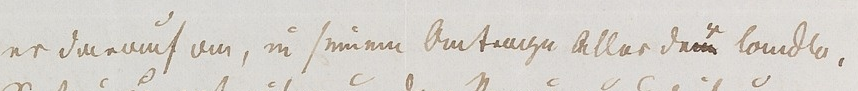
es darauf an, in seinem Antrage Alles demr landw.
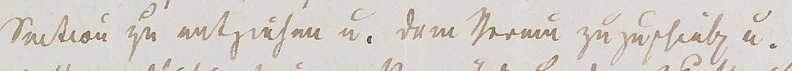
Section zu entziehen u. dem Verein zuzuschieben u.
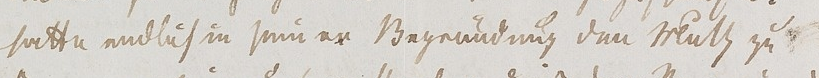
hatte endlich in seiner Begründung den Muth zu
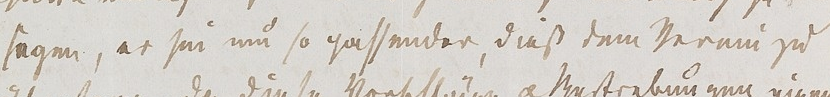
sagen, es sei um so passender, dieß dem Verein zu
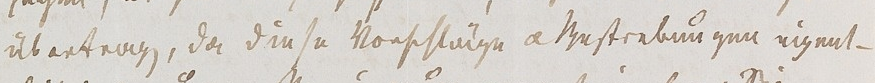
übertragen, da diese Vorschläge & Bestrebungen eigent-
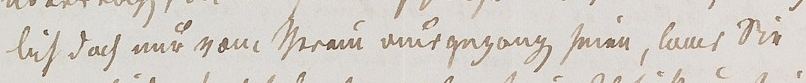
lich doch nur vom Verein ausgegangen seien, was Sie
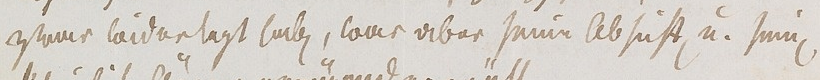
zwar widerlegt haben, was aber seine Absichten u seinen
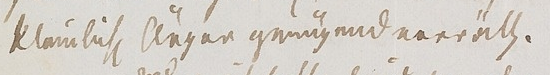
kleinlichen Ärger genügend verräth.
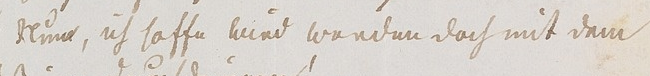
Nun, ich hoffe wir werden doch mit dem
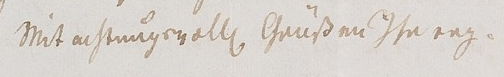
Mit achtungsvollen Grüßen Ihr erg.
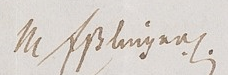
M Eßlinger
